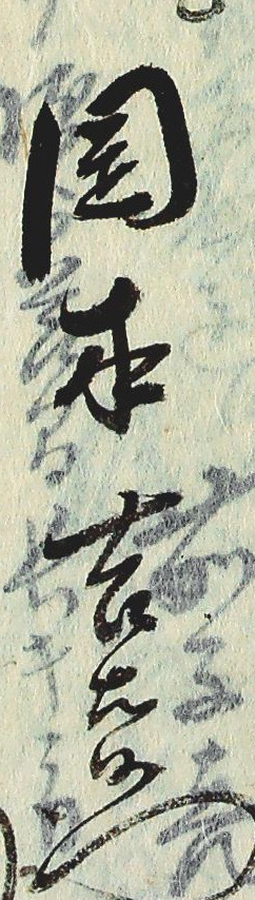岡本吉右衛門
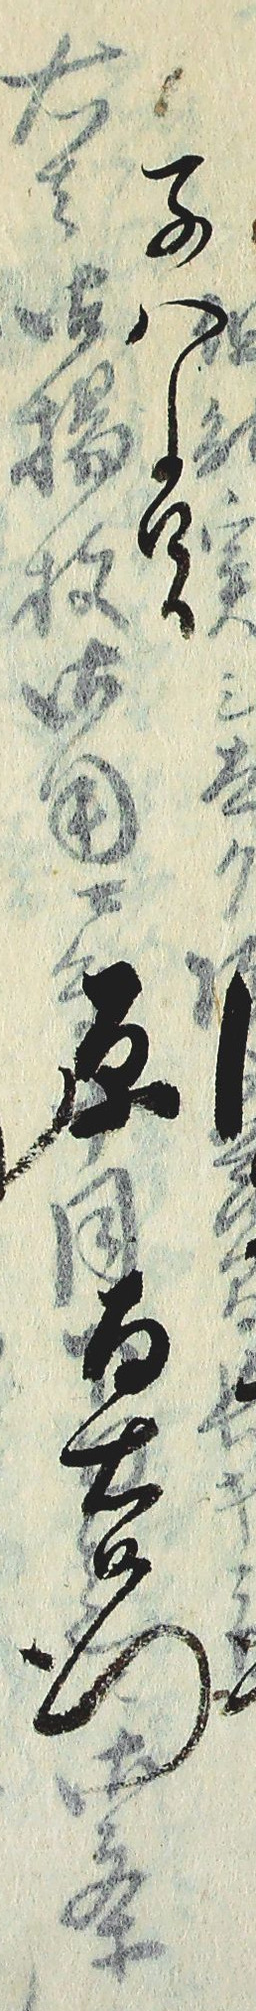子八月四日原与右衛門
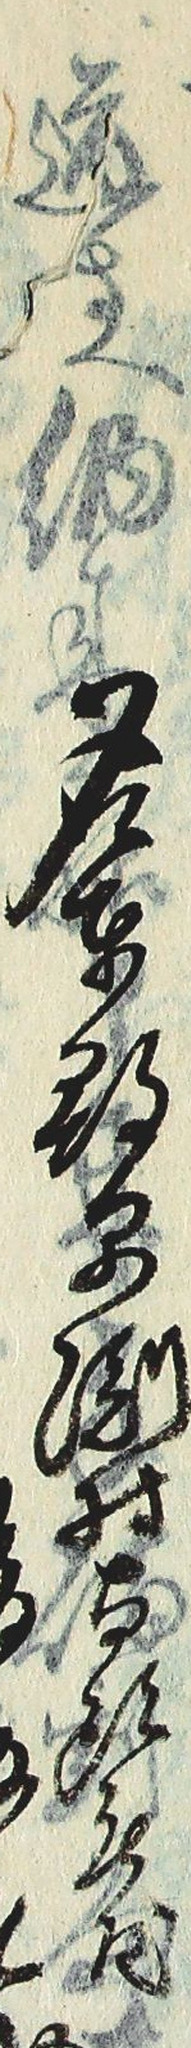名東郡早淵村与頭庄屋
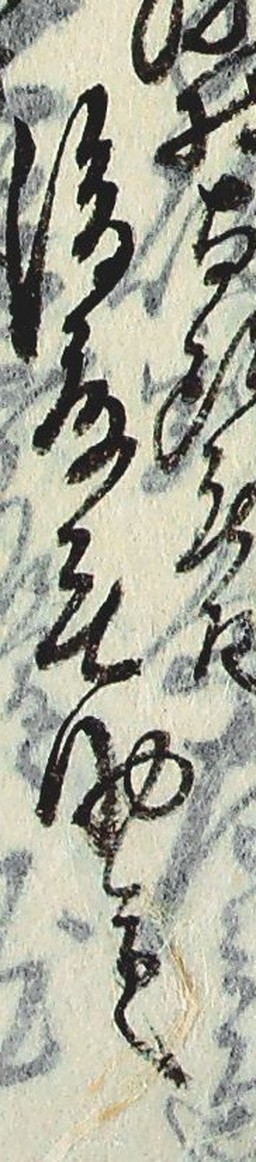後藤庄助方へ
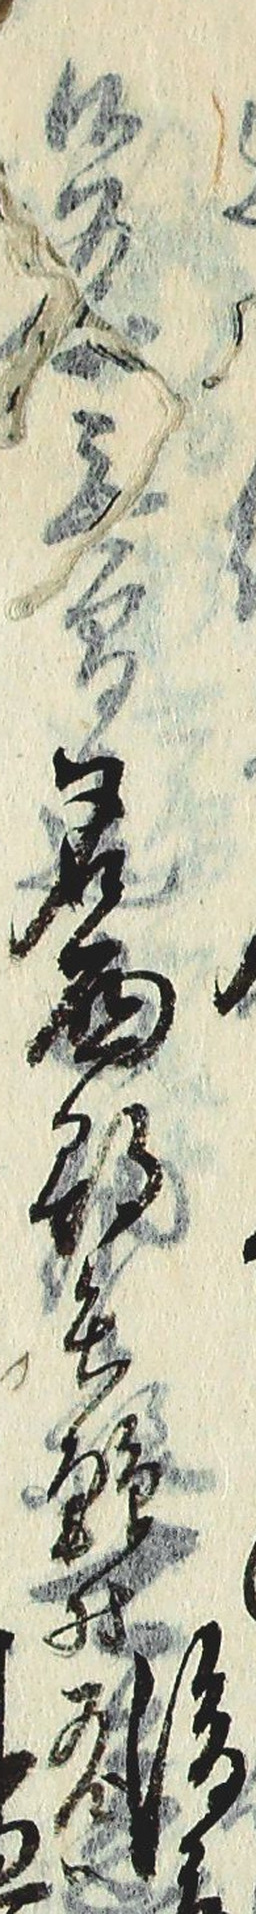名西郡矢野村右同
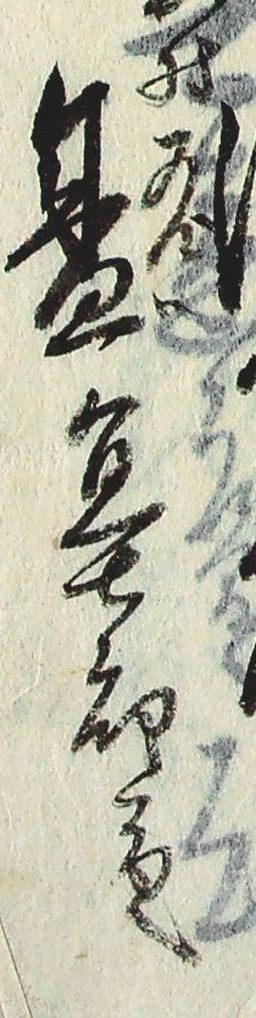盛宣七郎方へ

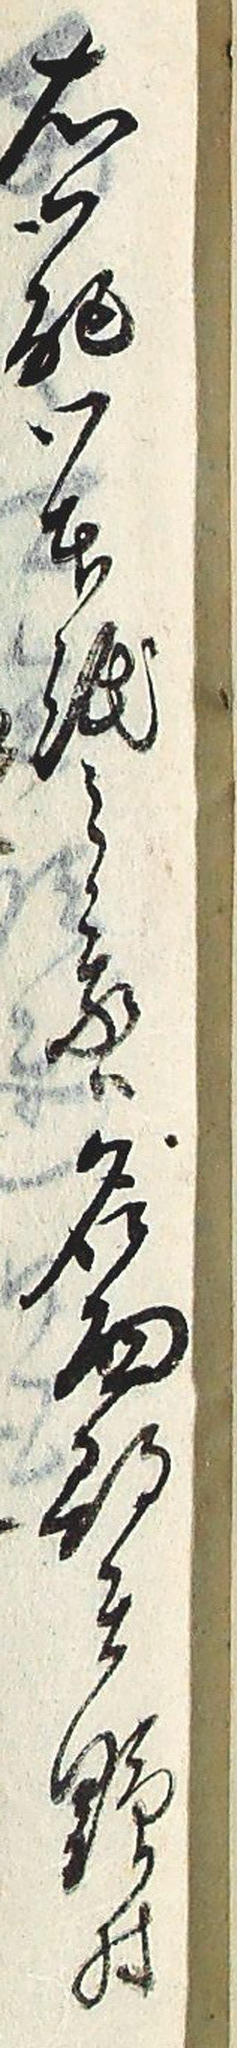右御配御本紙之義は名西郡矢野村
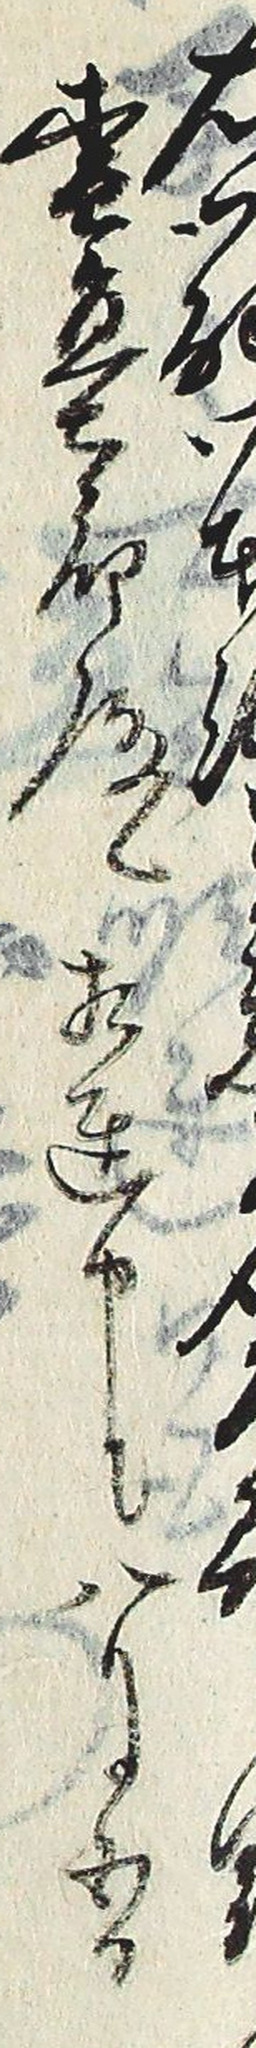盛宣七郎殿へ相達申候八月五日
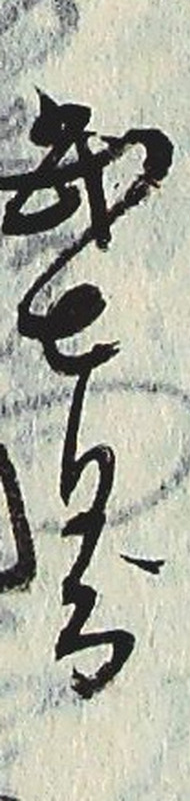当七月分
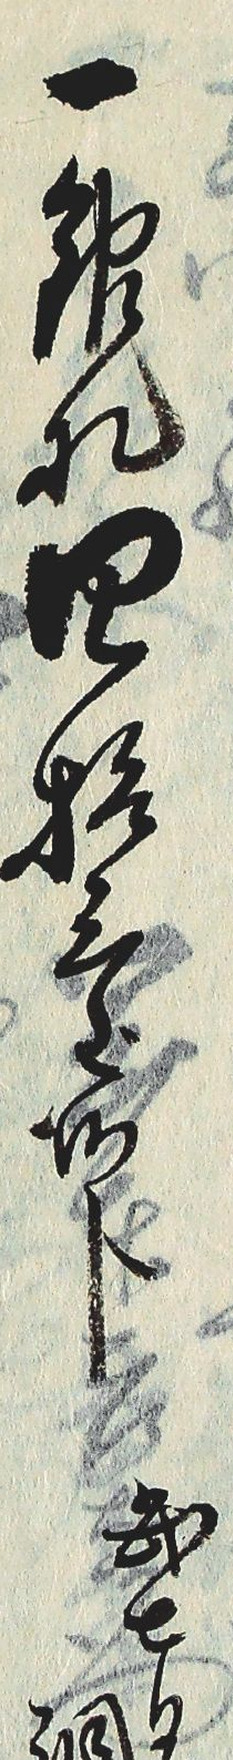一銀札四拾三匁弐分銅子人足賃
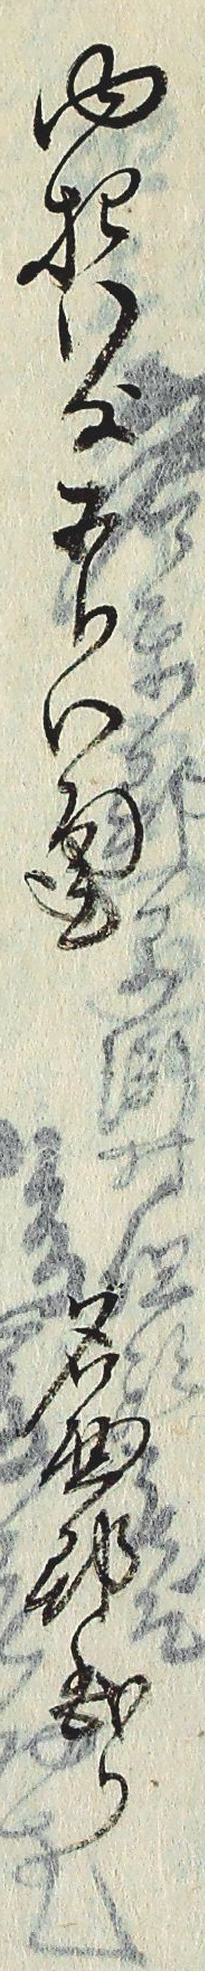内拾八匁五分八厘名西郡当り
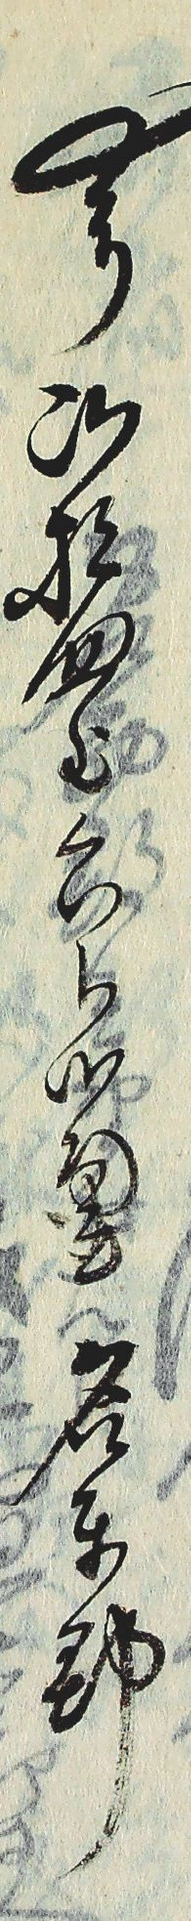残り弐拾四匁六分弐厘名東郡
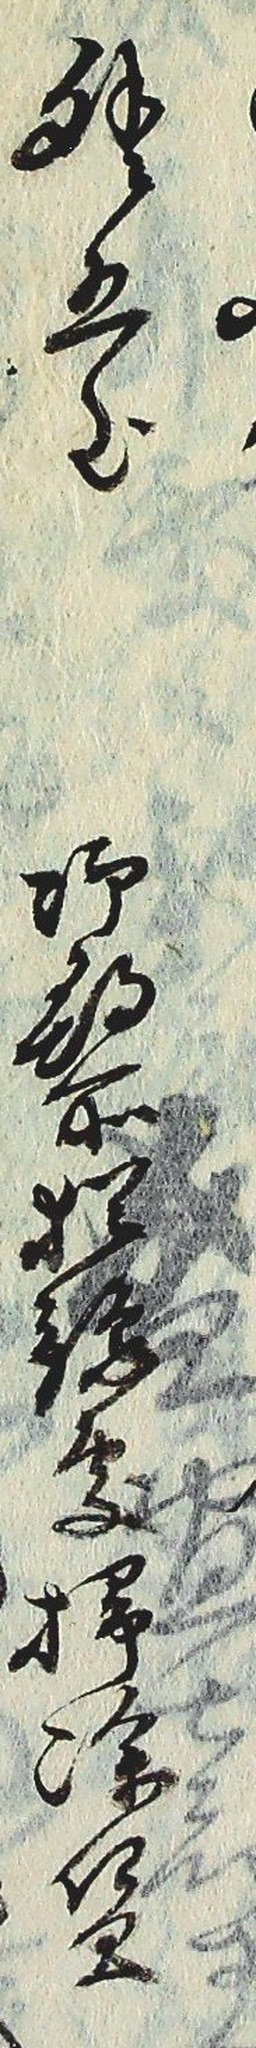外に五匁御郡所猶予処掃除賃
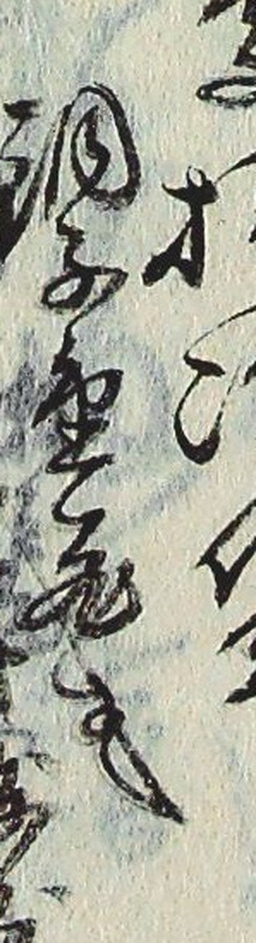銅子金蔵方へ
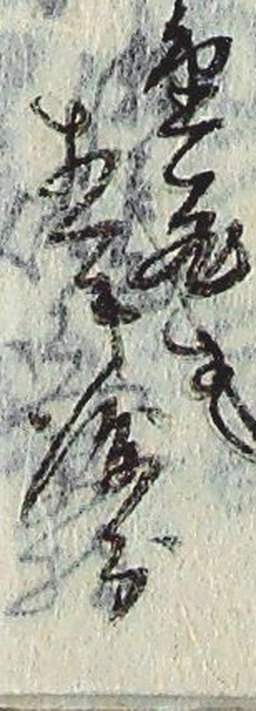直手渡分
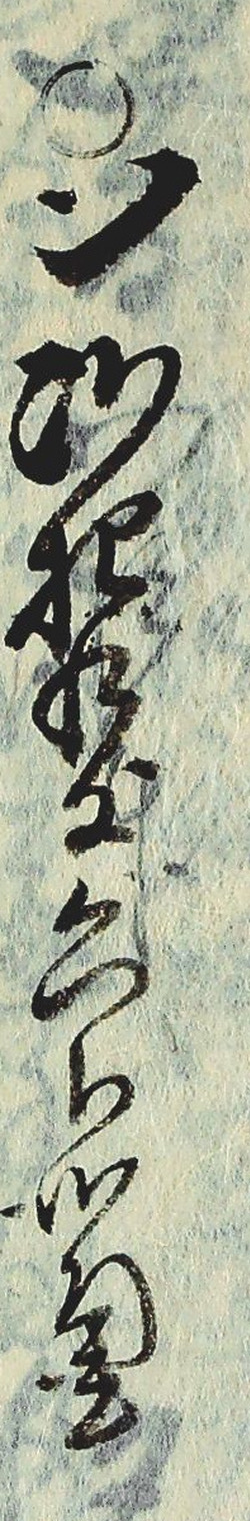〆弐拾九匁六分弐厘
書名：名東郡中諸割賦元帳
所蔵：鳴門教育大学 Naruto University of Education
